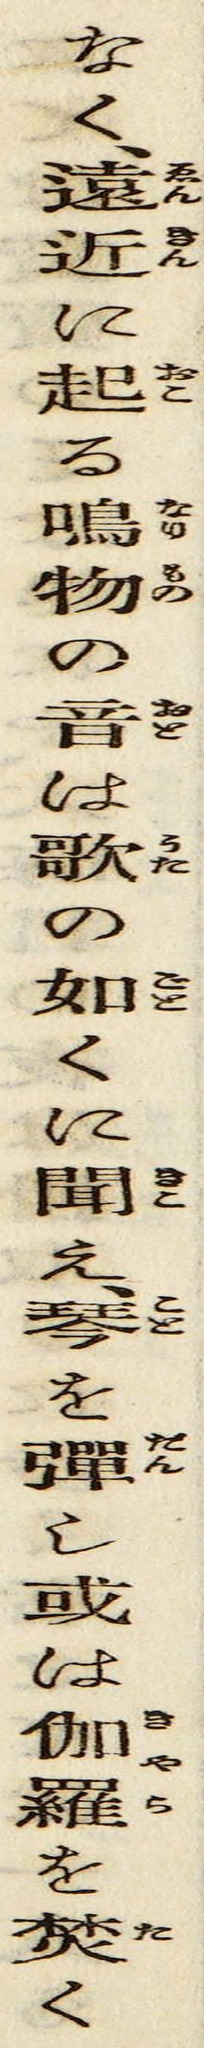なく、遠近に起る鳴物の音は歌の如くに聞え、琴を弾し或は伽羅を焚く
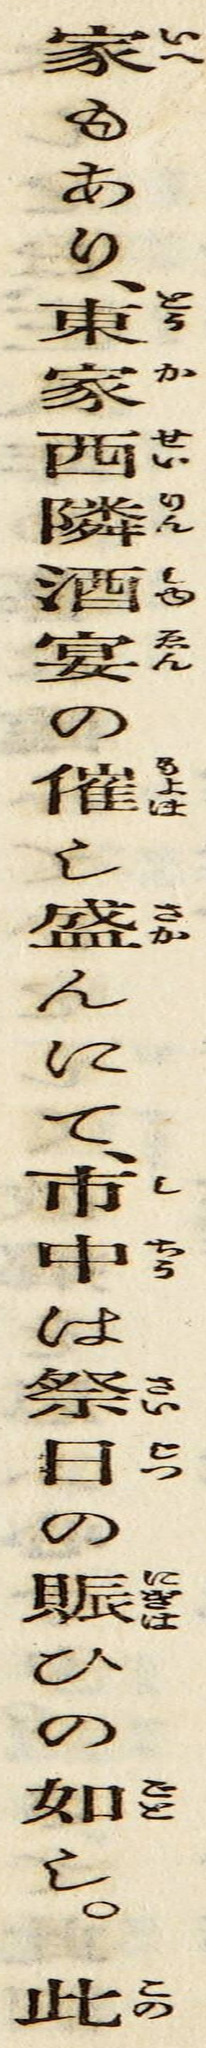家もあり、東家西隣酒宴の催し盛んにて、市中は祭日の賑ひの如し。此
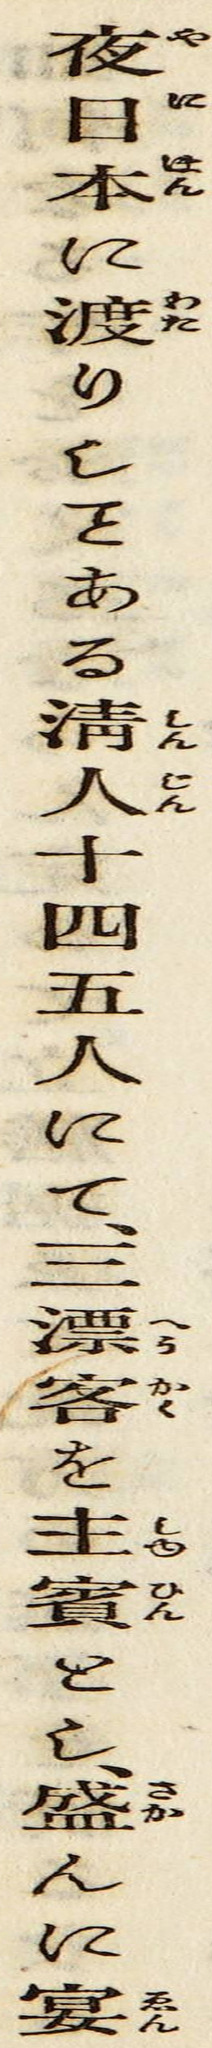夜日本に渡りしことある清人十四五人にて、三漂客を主賓とし、盛んに宴
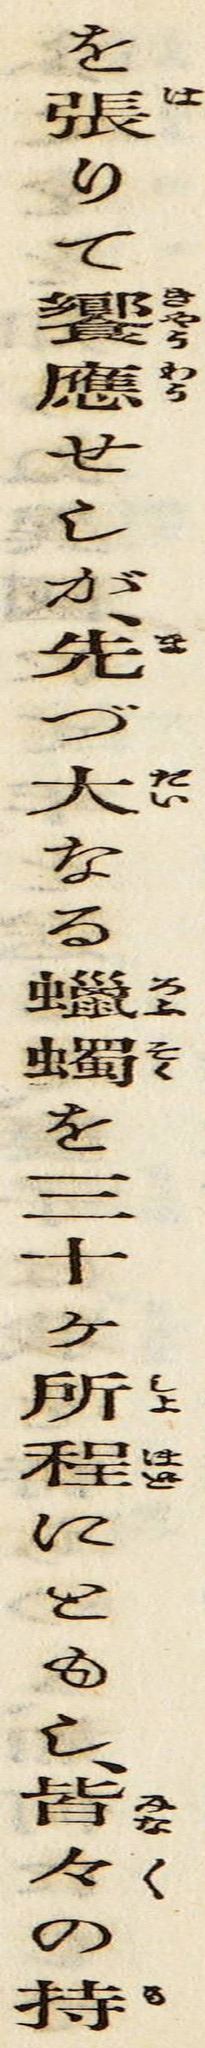を張りて饗応せしが、先づ大なる蝋燭を三十ケ所程にともし、皆々の持
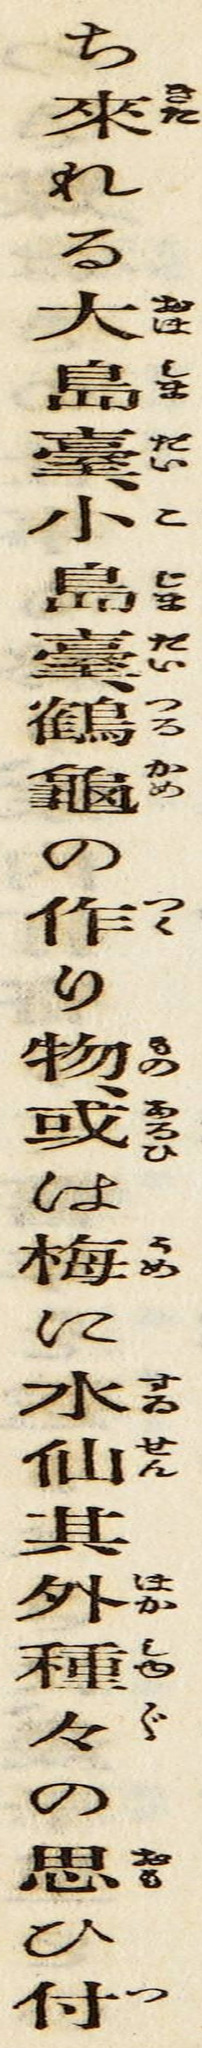ち来れる大島台、小島台、鶴亀の作り物、或は梅に水仙其外種々の思ひ付
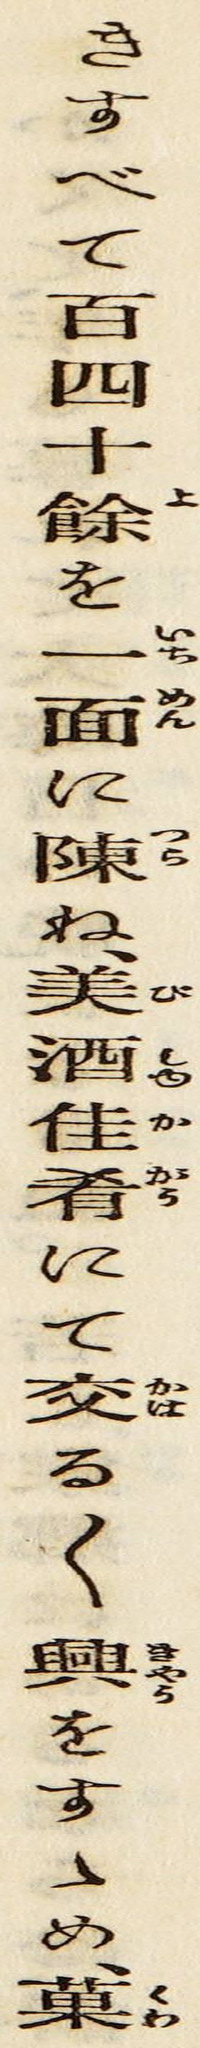きすべて百四十余を一面に陳ね、美酒佳肴にて交る〳〵興をすゝめ、菓
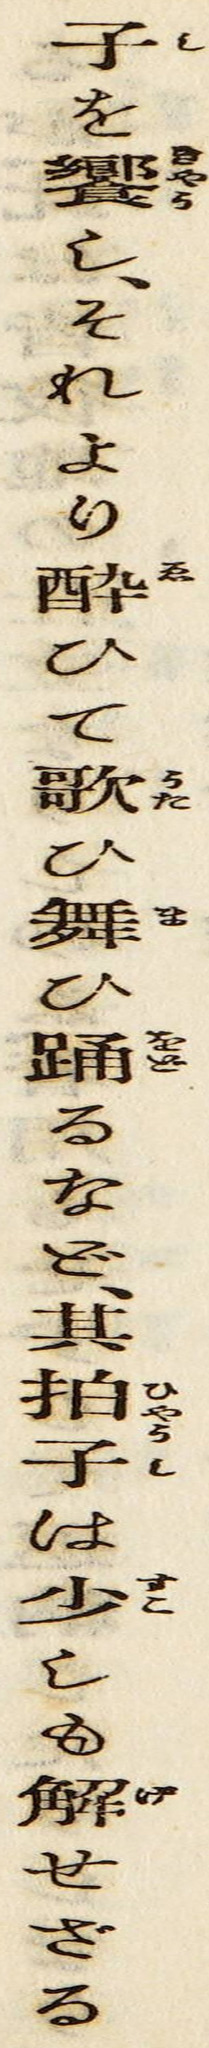子を饗し、それより酔ひて歌ひ舞ひ踊るなど、其拍子は少しも解せざる
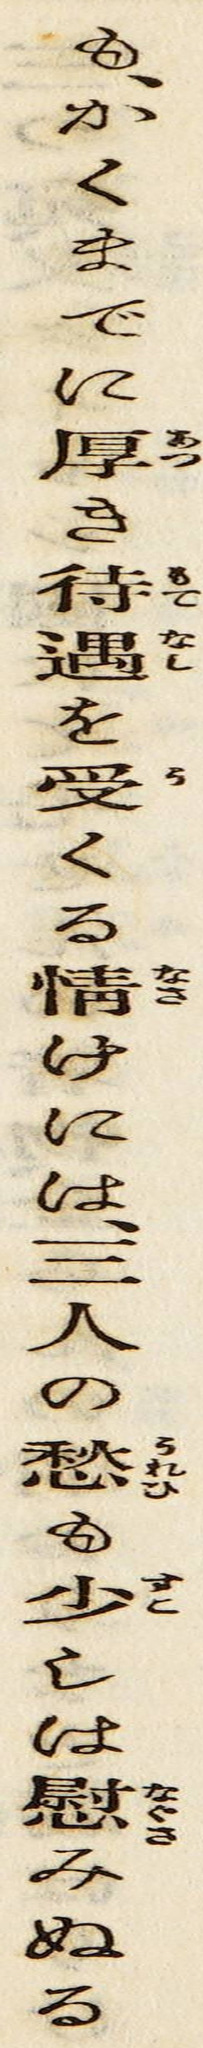も、かくまでに厚き待遇を受くる情けには、三人の愁も少しは慰みぬる
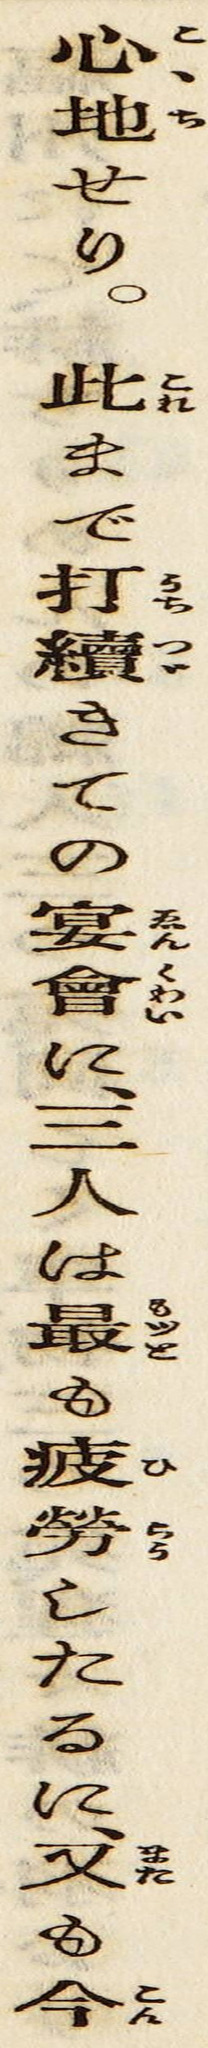心地せり。此まで打続きての宴会に、三人は最も疲労したるに、又も今
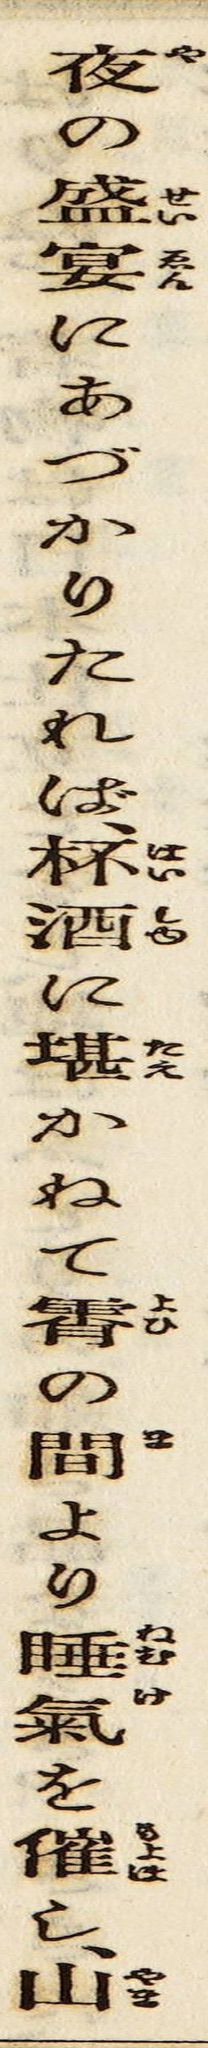夜の盛宴にあづかりたれば、杯酒に堪かねて霄の間より睡気を催し、山
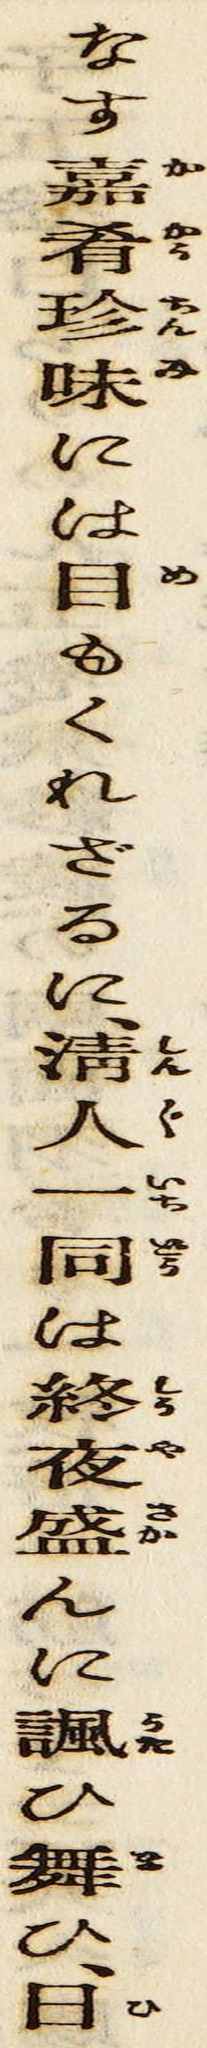なす嘉肴珍味には目もくれざるに、清人一同は終夜盛んに諷ひ舞ひ、日
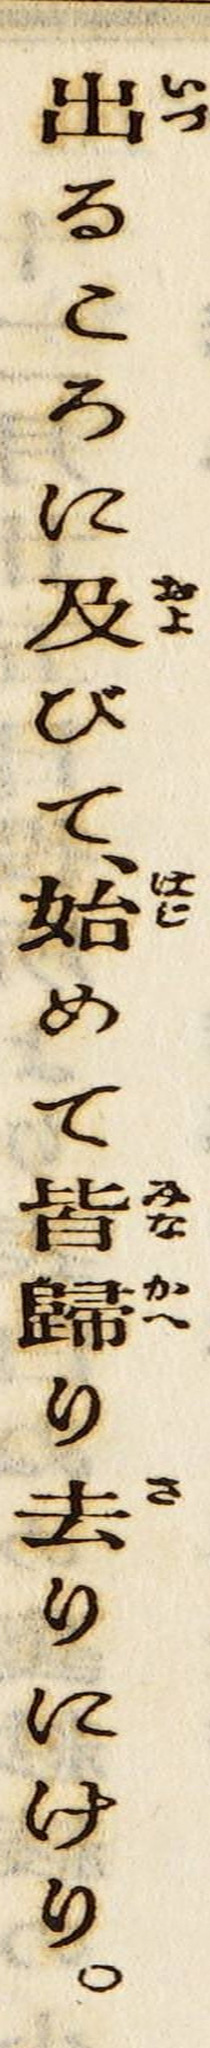出るころに及びて、始めて皆帰り去りけり。
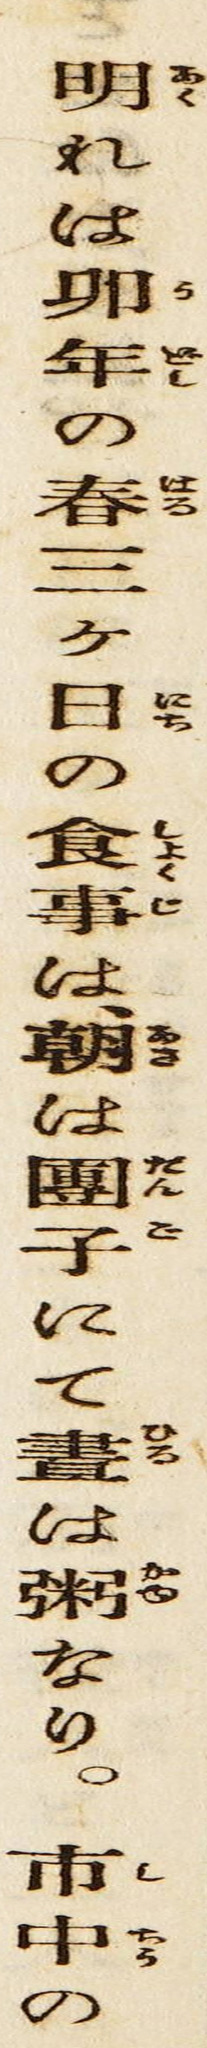明れば卯年の春三ケ日の食事は、朝は団子にて昼は粥なり。市中の
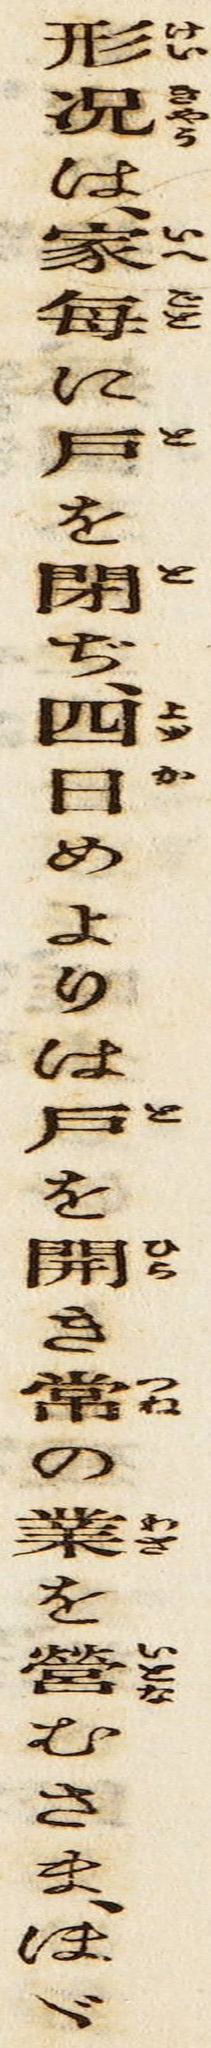形況は、家毎に戸を閉ぢ、四日めよりは戸を開き常の業を営むさま、ほヾ
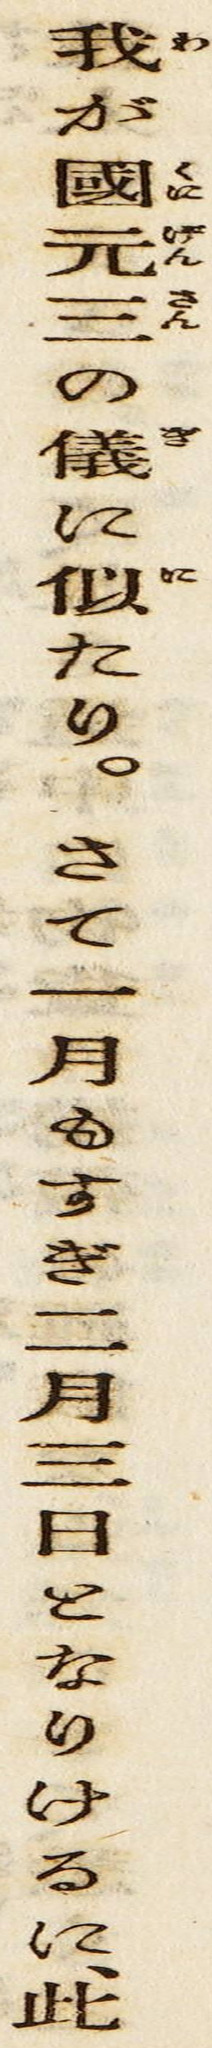我が国元三の儀に似たり。さて一月もすぎ二月三日となりけるに、此
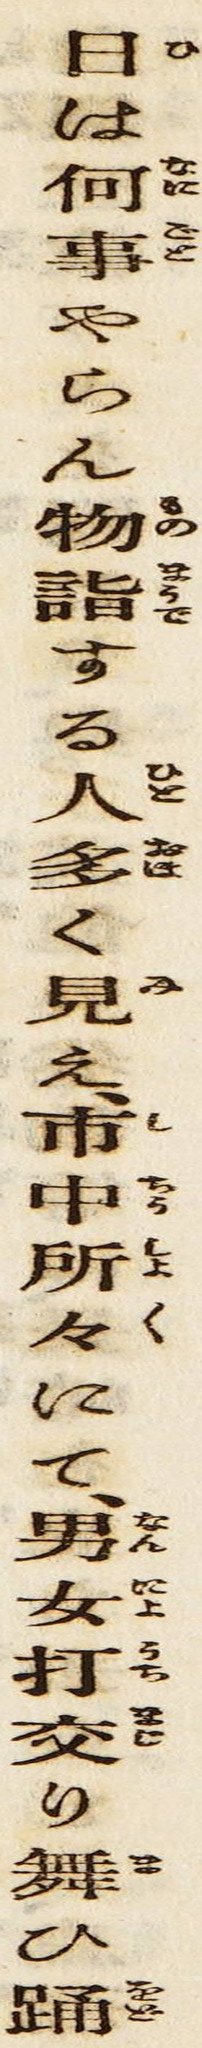日は何事やらん物詣する人多く見え、市中所々にて、男女打交り舞ひ踊
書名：日本漂流譚
